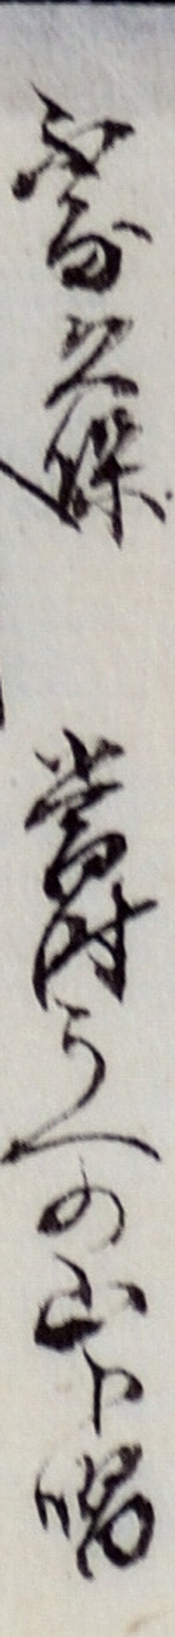ふな久保当時うへの山ト唱
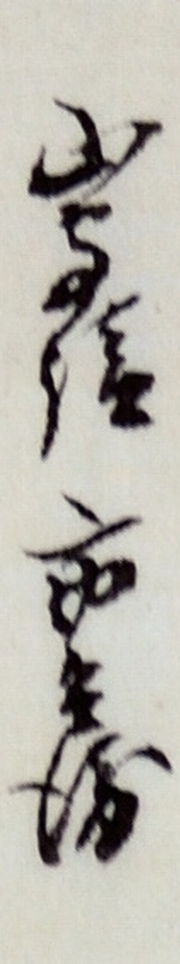山守請市兵衛
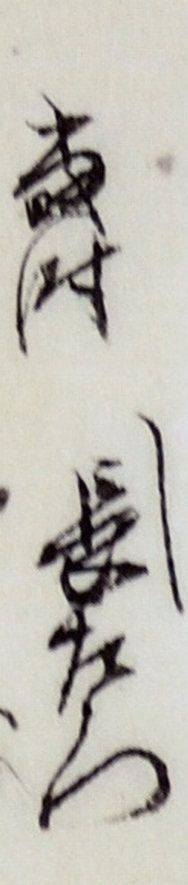当時長左衛門
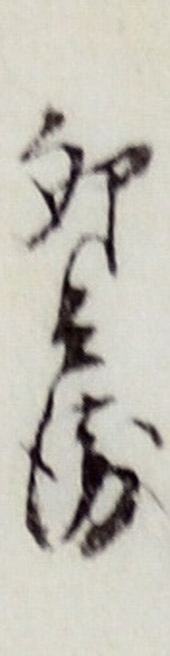卯兵衛
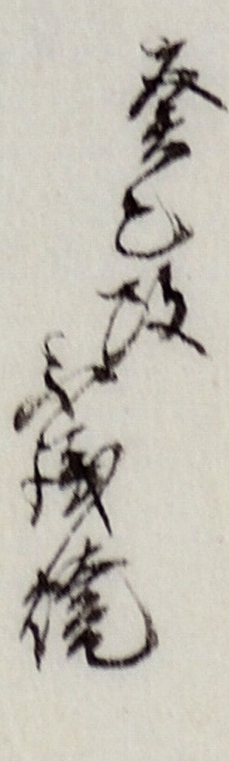癸巳改
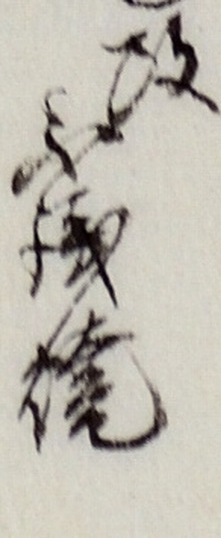不残焼
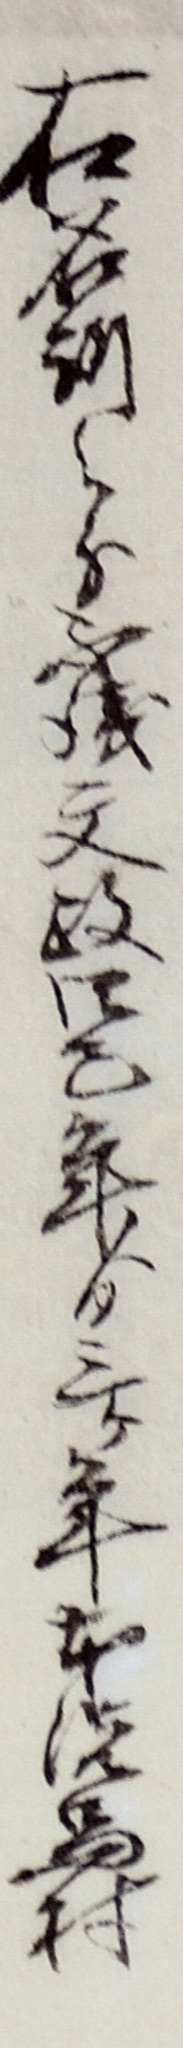右名所之分不残文政四巳年ゟ三ケ年本洗馬村
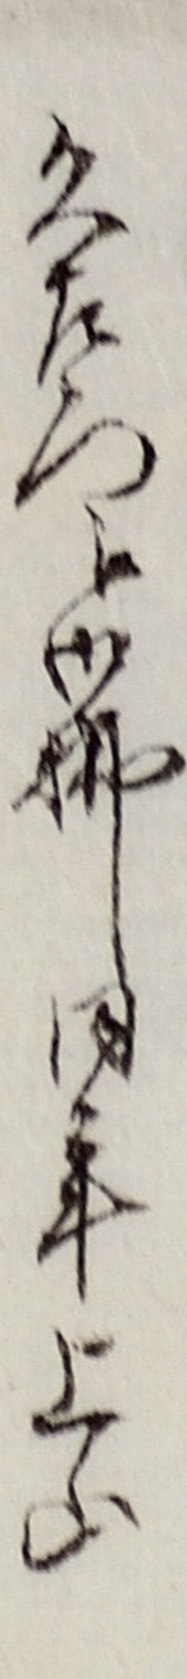久左衛門え御払同年上山
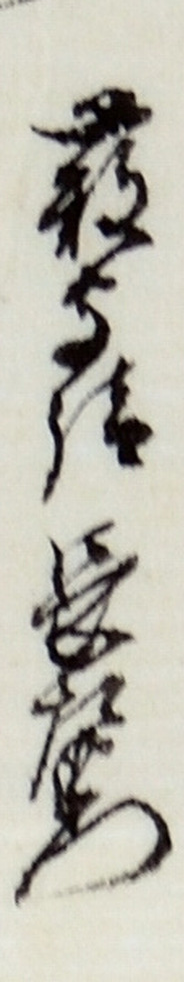藪守請長左衛門
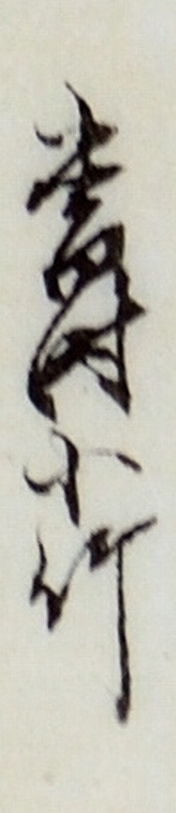当時小竹
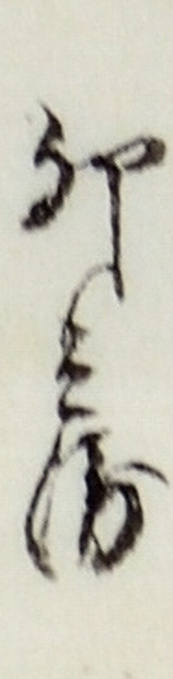卯兵衛

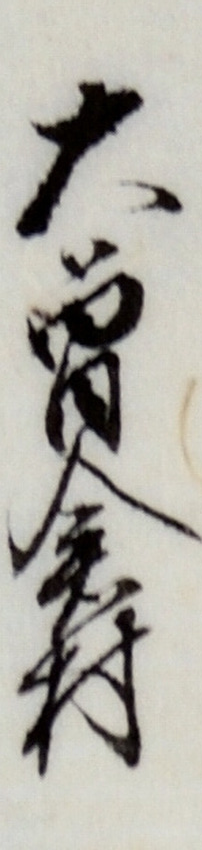大曽倉村
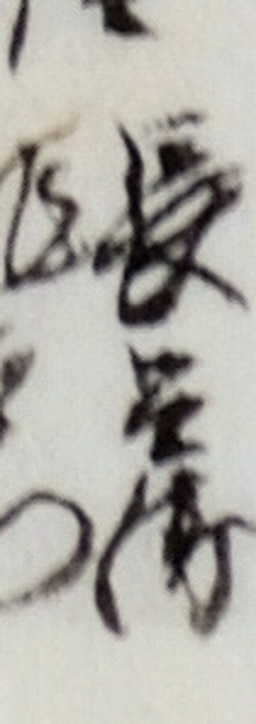作右衛門
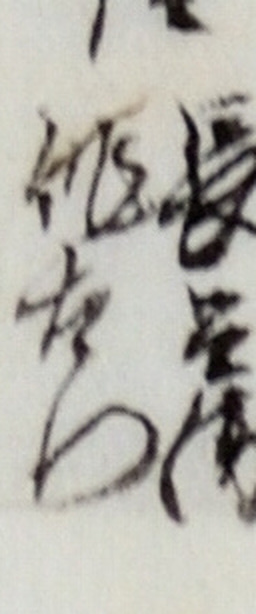作右衛門
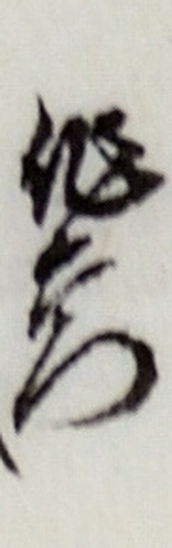作右衛門
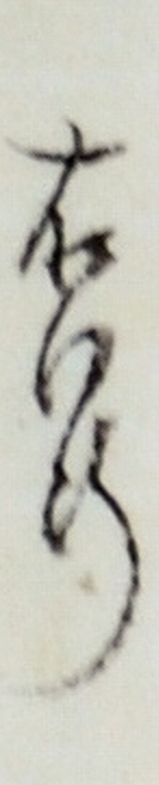右同断
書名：山林帳草稿
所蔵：伊那市立高遠町図書館・合同会社AMANE
